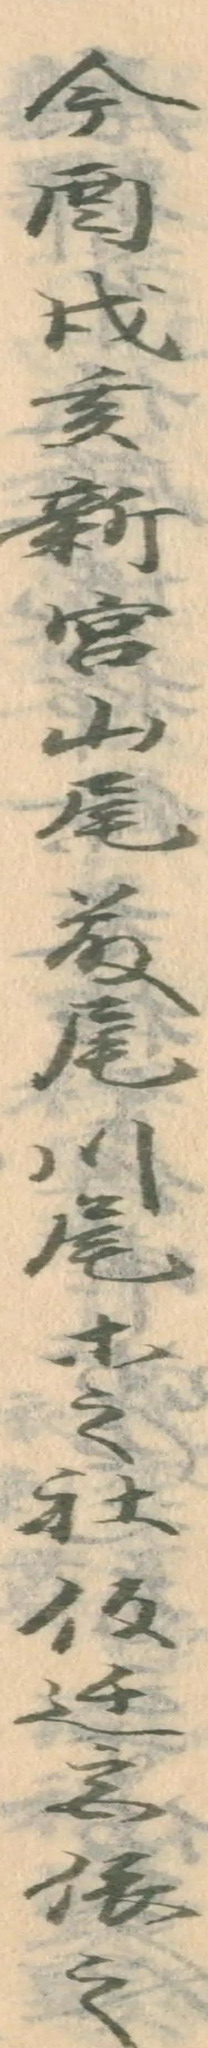一今酉戊亥新宮山尾藤尾川尾等之社仮迁宮依之
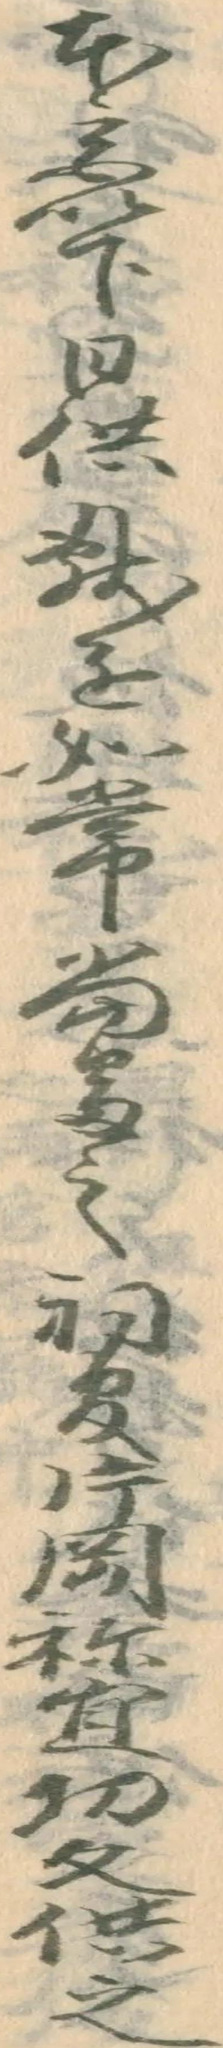本宮以下日供献進如常当番之祠官片岡祢宜功久供之

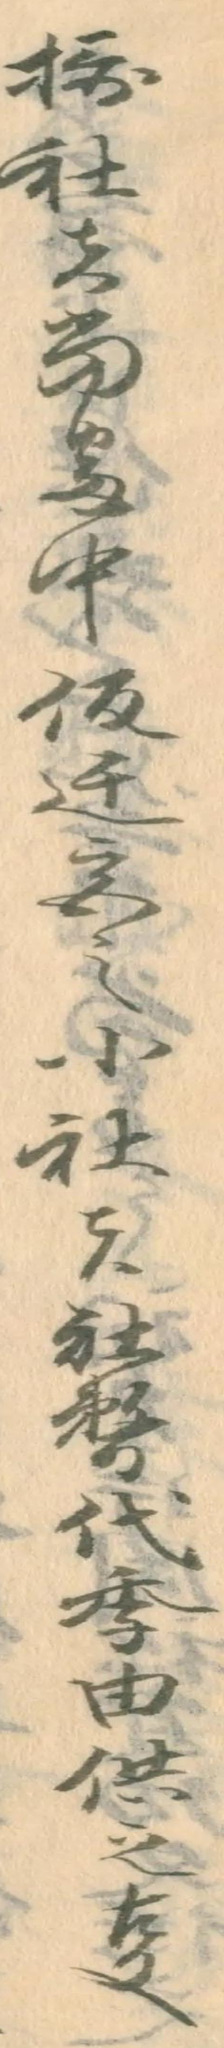摂社は当番中仮迁宮之小社は社務代季由供之事
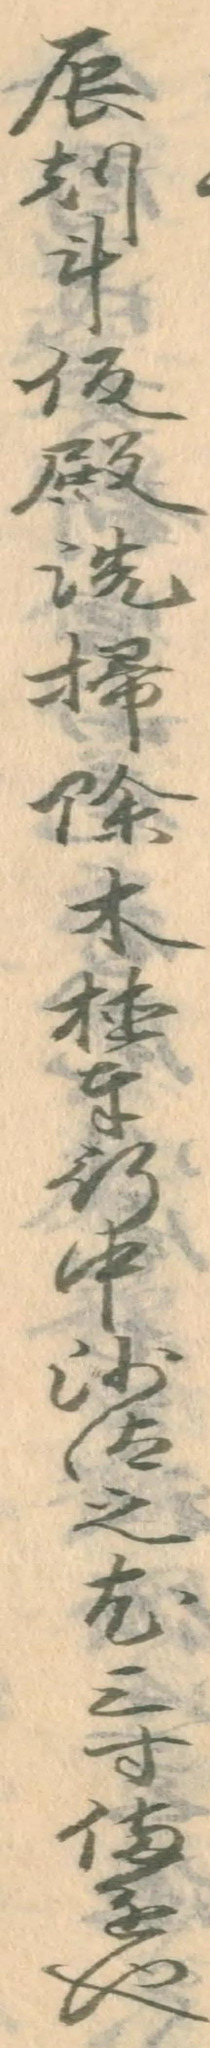一辰刻計仮殿洗掃除木植奉行中沙汰之尤三寸備進也
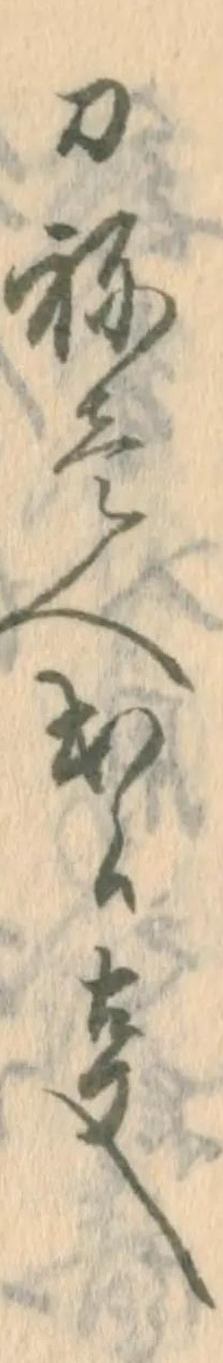刀祢壱人出候事
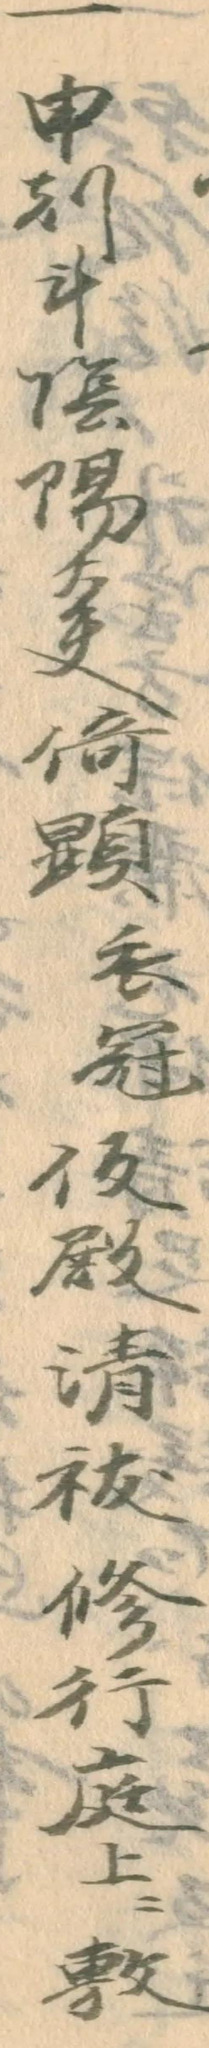一申刻計陰陽大夫倚顕衣冠仮殿清祓修行庭上ニ敷
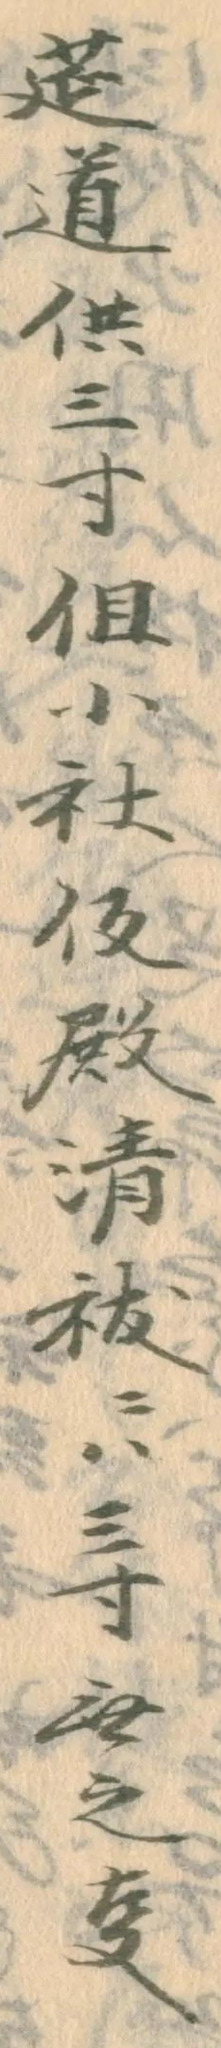筵道供三寸但小社仮殿清祓ニハ三寸無之事
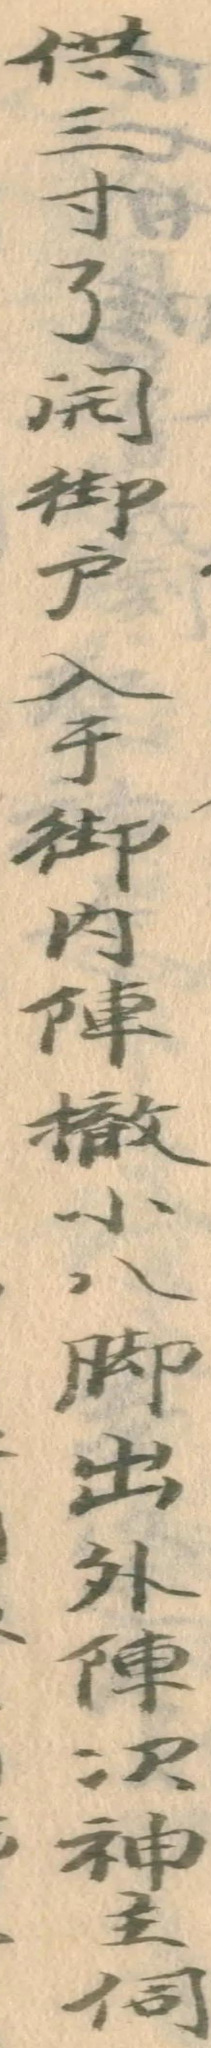供三寸了開御戸入于御内陣撤小八脚出外陣次神主伺
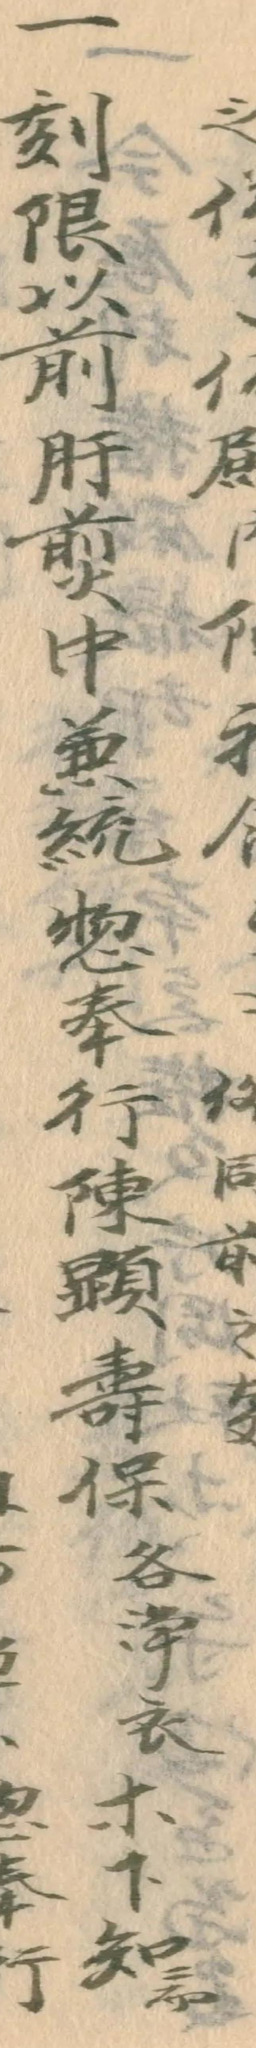一刻限以前肝煎中兼統惣奉行陳顕寿保各浄衣等下知ニ而
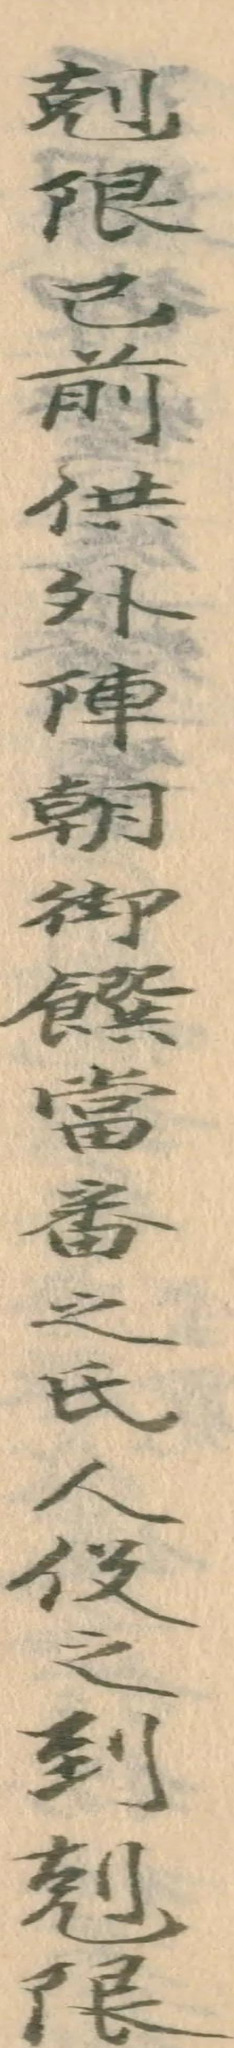一剋限已前供外陣朝御饌当番之氏人役之到剋限
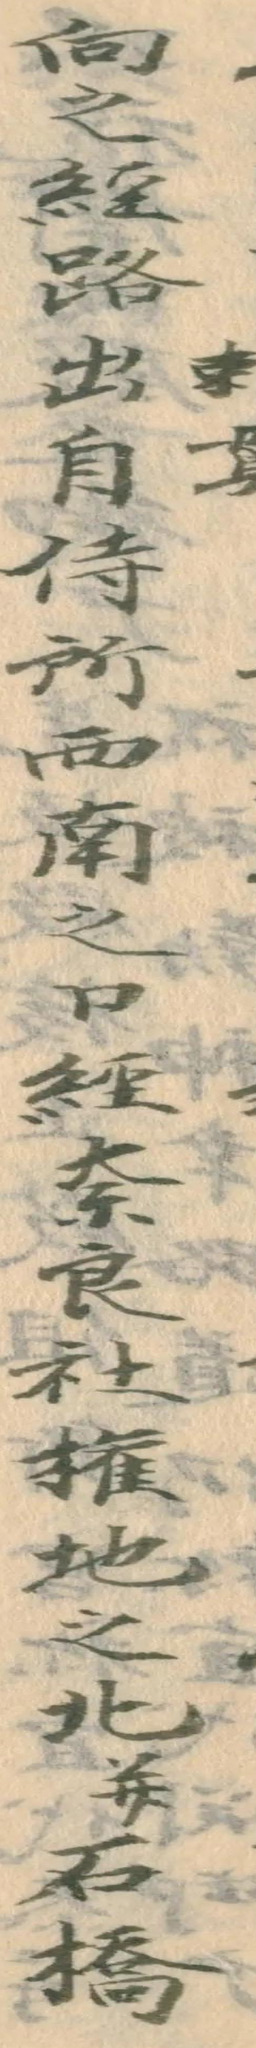向之経路出自侍所西南之口経奈良社權地之北并石橋

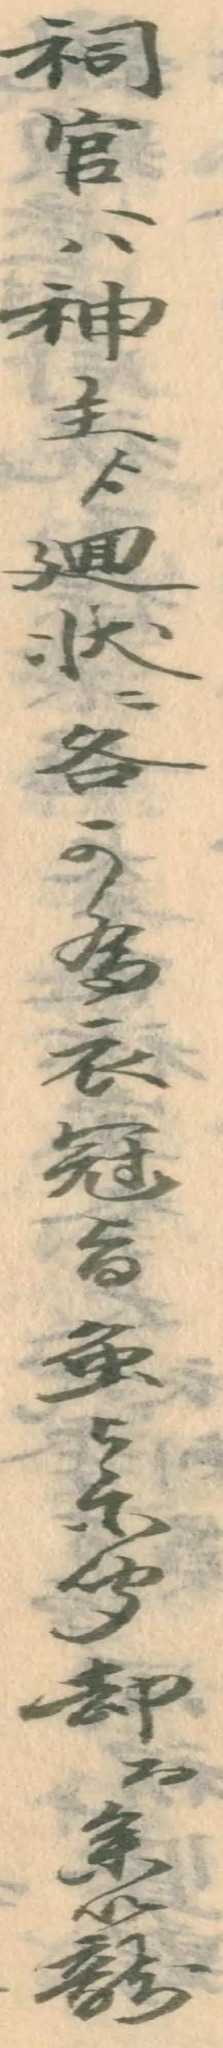祠官ヘハ神主ゟ廻状ニ各可為衣冠旨雖被示聞却而参籠
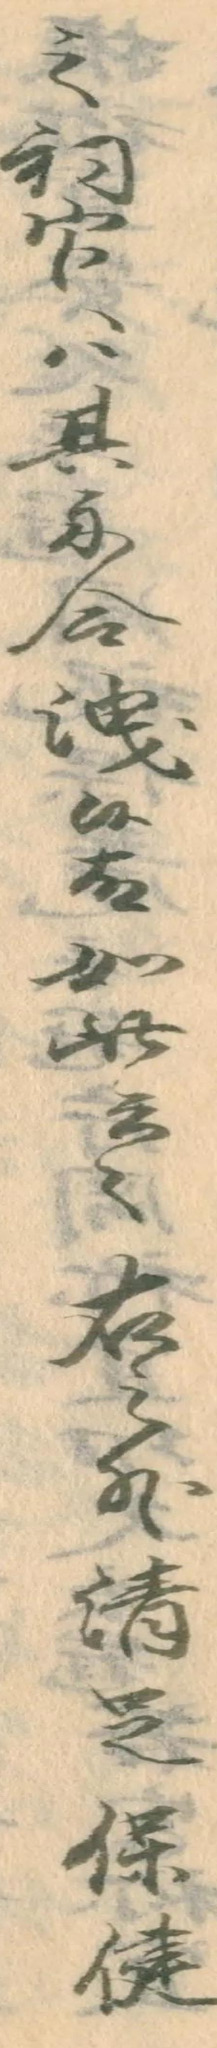之祠官ヘハ其示合洩候故如此云々右之外清足保健
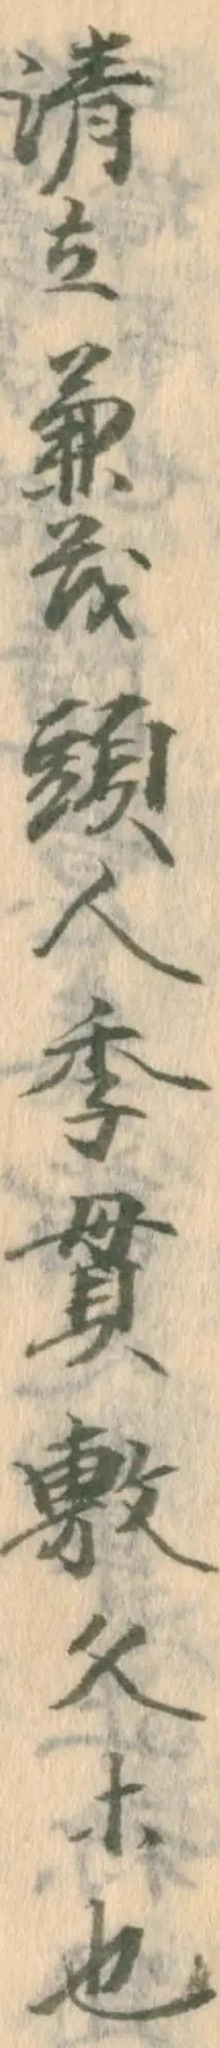清立兼茂頭人季貫敷久等也
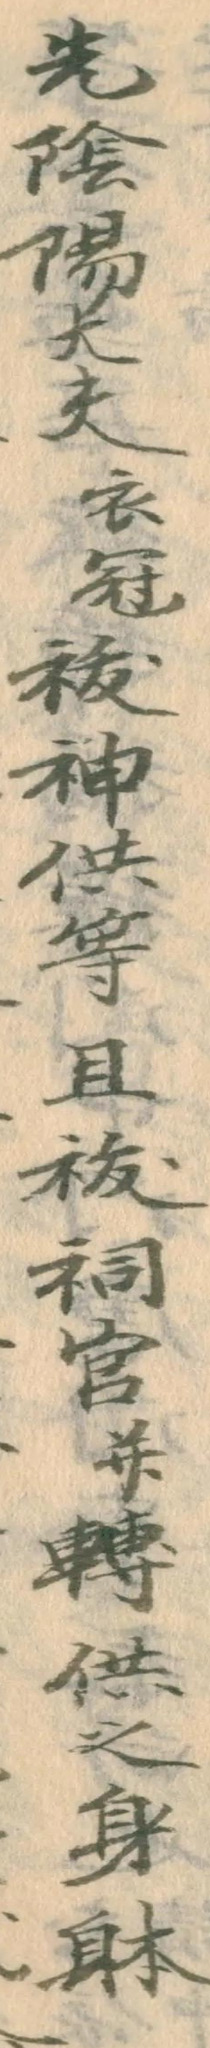先陰陽大夫衣冠祓神供等且祓祠官并転供之身体
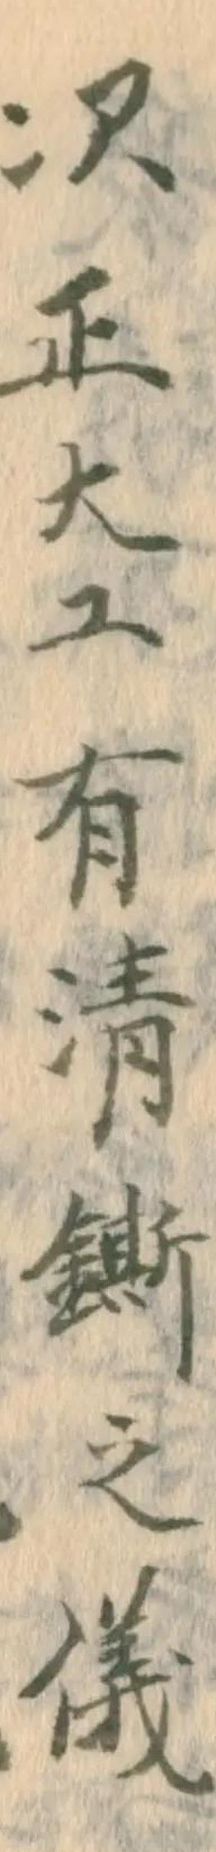次正大工有清鐁之儀
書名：賀茂社記録. 第17冊
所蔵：国立国会図書館 National Diet Library, JAPAN
